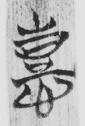𢝫
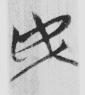𡚦
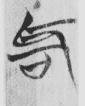{㠯ㅋ}
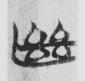㡭
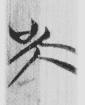吳
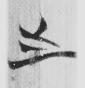之
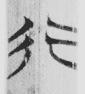行
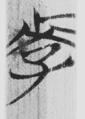李
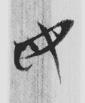母
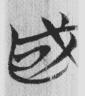或
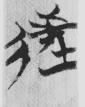{彳之𡈼}
